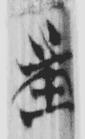市
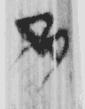多
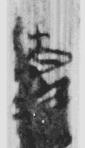{直臣}
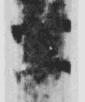五
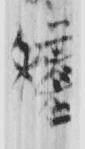穜
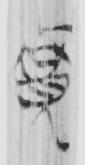貴
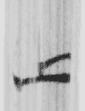上
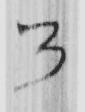乃
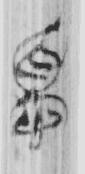𢝊
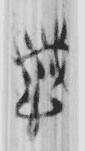慼
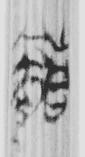{骨青}
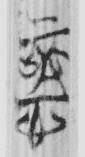{亟心}
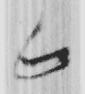㠯（以）
